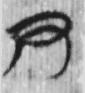尹
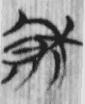穆
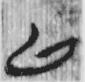㠯（以）
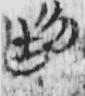○（廷）
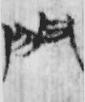門
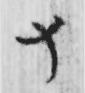又
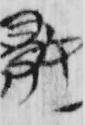敗
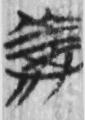義
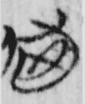○（付）
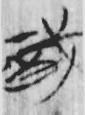戠
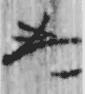之
